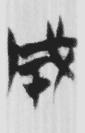成
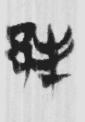邦
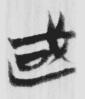或
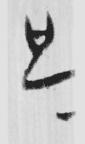也
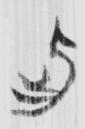此
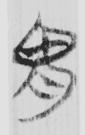胃
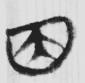因
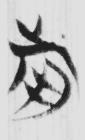歬
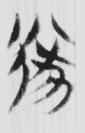{彳㒸}
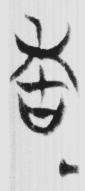𬚋
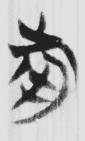歬
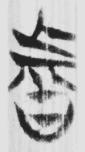者
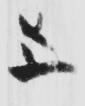之
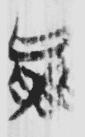能
